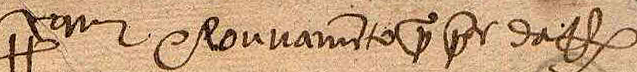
ꝓpçam e louuamēto p̄o p̄te da Rꝭ
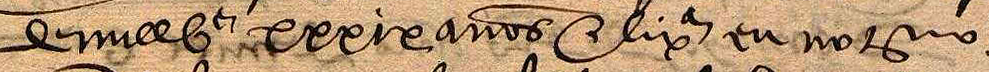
de mill bc xxxix anos ē lixa eu notro
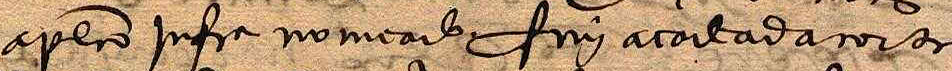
apl̄co Jnfra nomeado fuy a cadea da corte
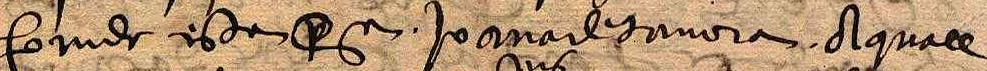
homde esta p̄sa. Joana de tauora. A quall
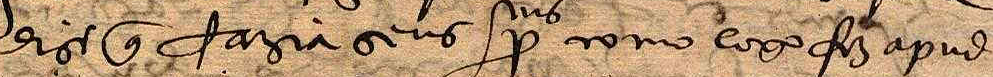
dise q̄ fazia seus ꝓres como logo fez apud
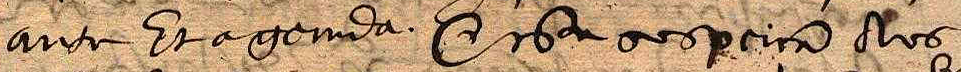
ante Et agemda. ē esta sospeiçā Aos
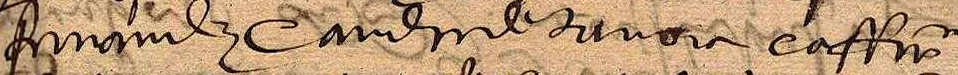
fernandez e andre de tauora e a ffrrco
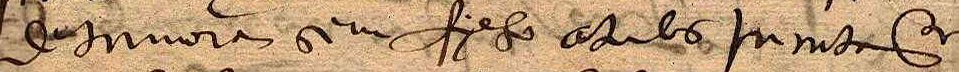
de tauora seu fylho a todos Juntamte
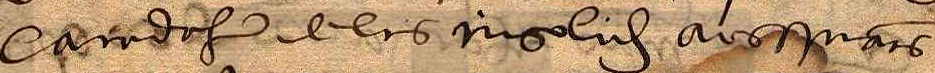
e a cada hū deles in solid aos quaes
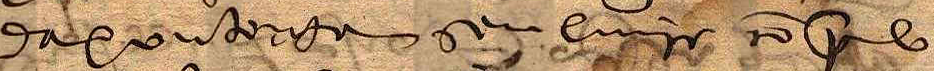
da e outorga seu liure c̄op̄do
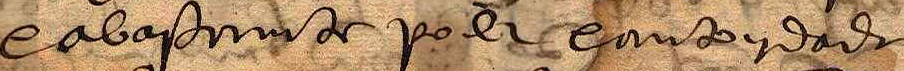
e abastamte poder e autorjdade
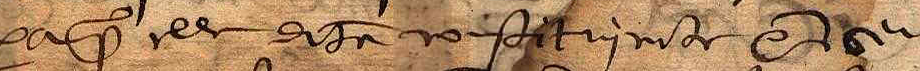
ꝑa p̄o ella dita constitujnte e ē seu
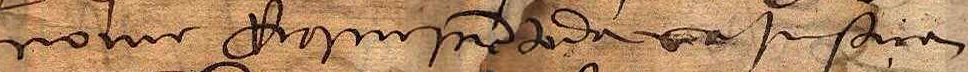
nome Requerē toda sa Justiça
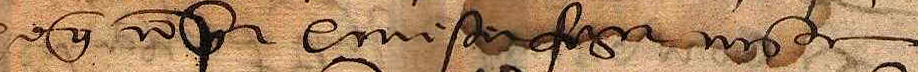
e o q̄ c̄op̄r e mester fezer nesta
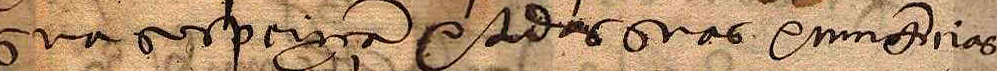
sua sospeyaçā e todas suas emergēcias
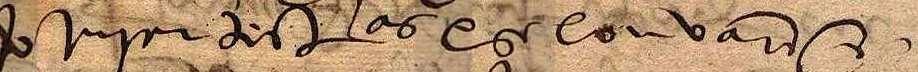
ꝟ jurar testas e se louvarē ē
